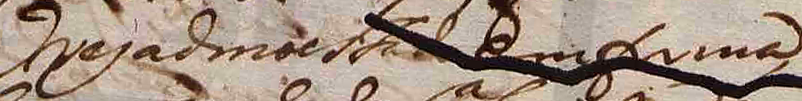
ves admoestad_ em forma,
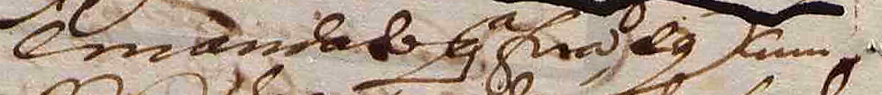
e mandado pa fora, e q̄ cum
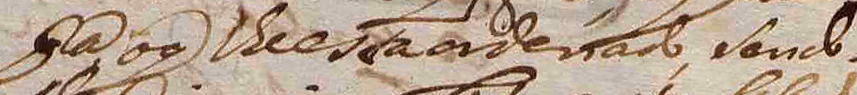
pRa o q̄ lhe esta ordenado, sendo
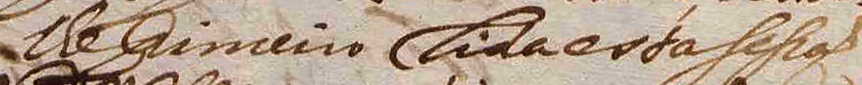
lhe pRimeiro lida esta sessaõ
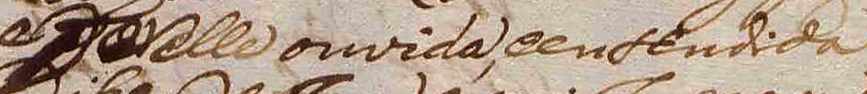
e por elle ouvida, e entendida
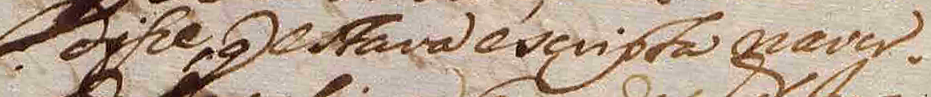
disse, q̄ estava escripta na ver
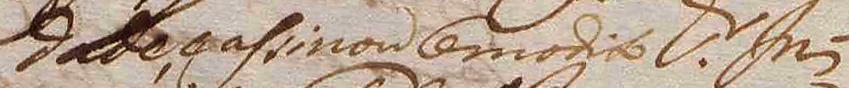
dade, e assinou Com o dito S.r Jn
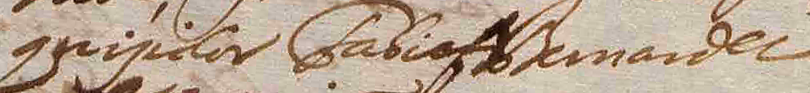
quisidor Fabiaõ Bernardez
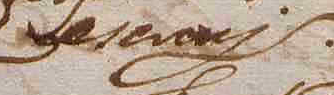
o escreui.
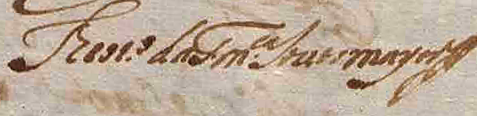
Theot.o da Fon.ca Soutomayor
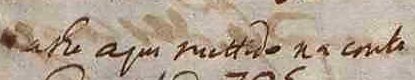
athe aqui mettido na conta
